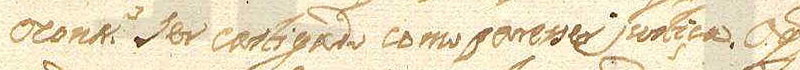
o contr.o ser castigado como paresser justiça. O q̄
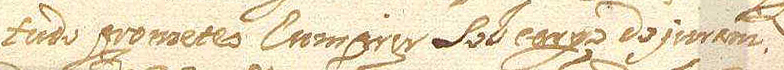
tudo prometeo Cumprir sob cargo do juram.to
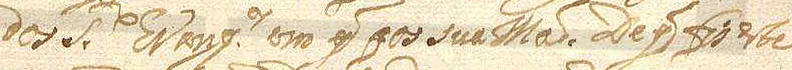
dos S.tos EVang.os em q̄ pos sua Maõ De q̄ fiz este
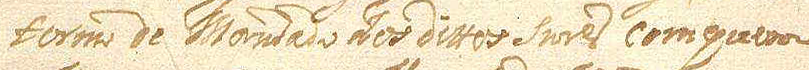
termo de Mandado dos dittos Snres com quem
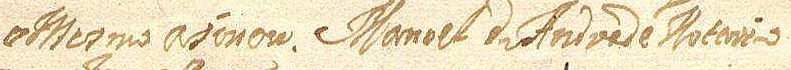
o Mesmo asinou. Manoel de Andrade Notario
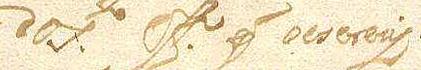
do S.to Off.o q̄ o escreuj.
